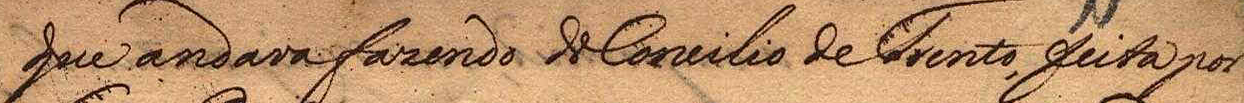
que andava fazendo do Concilio de Trento, feita por
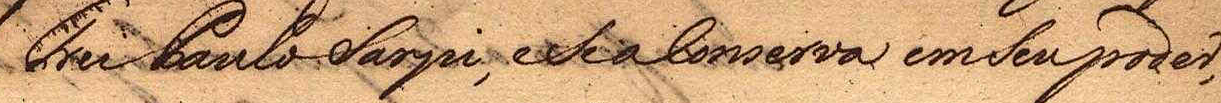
Frei Paulo Sarpi, e Si a Conserva em Seu poder,
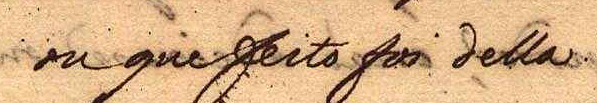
ou que feito foi della?
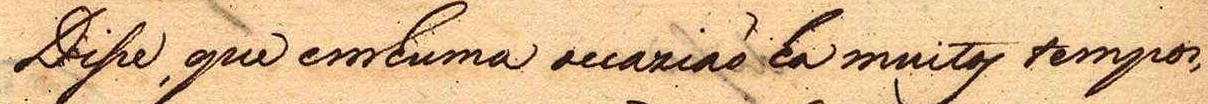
Disse, que em huma occaziaõ ha muitos tempos,
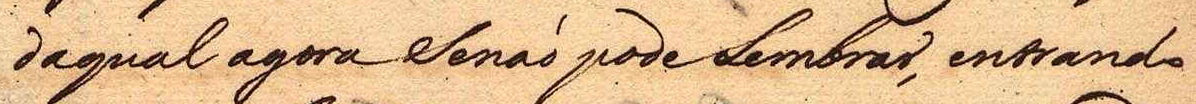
da qual agora Senaõ pode Lembrar, entrando
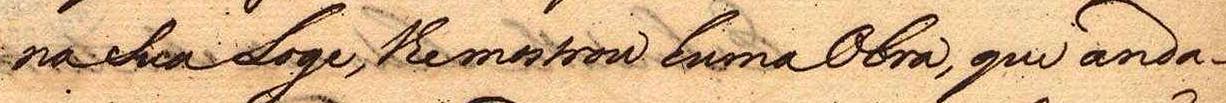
na Sua Loge, lhe mostrou huma Obra, que anda
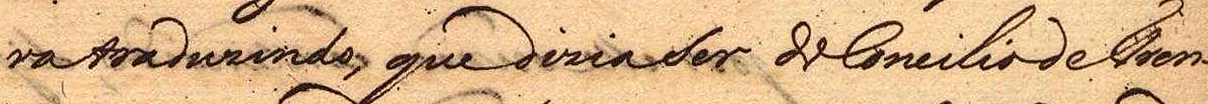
va traduzindo, que dizia Ser do Concilio de Tren
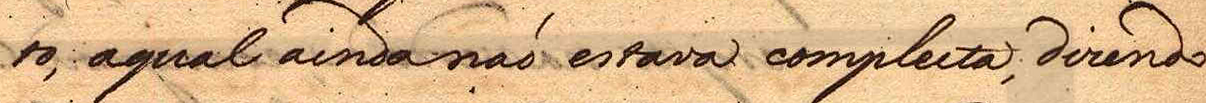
to, a qual ainda naõ estava complecta, dizendo
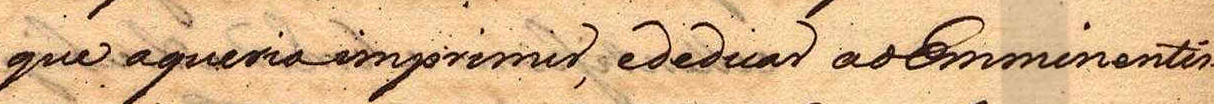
que a queria imprimir, e de duas ao Emminentis
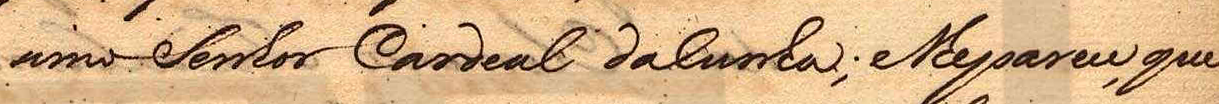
simo Senhor Cardeal da Cunha; e lhe parece, que
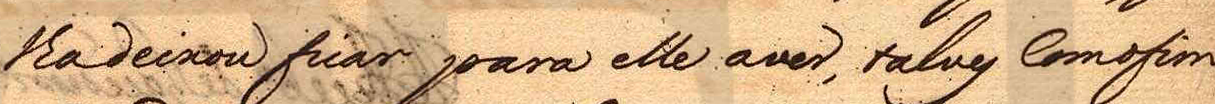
lha deixou ficar para elle a ver, talvez Com o fim
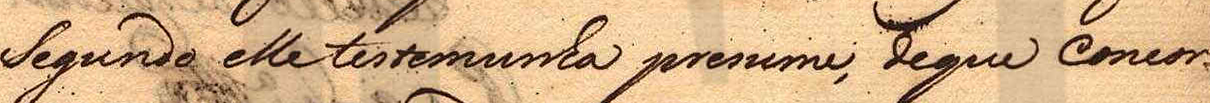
Segundo elle testemunha presume, de que concor
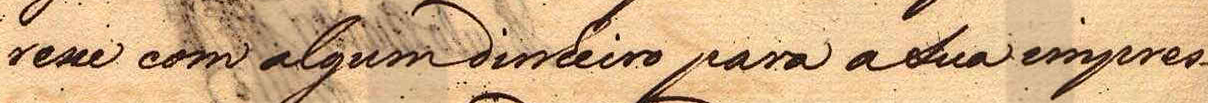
resse com algum dinheiro para a Sua impres
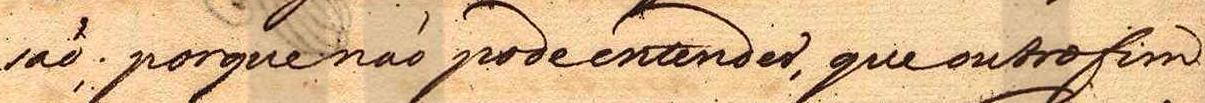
saõ; porque naõ poder entender, que outro fim
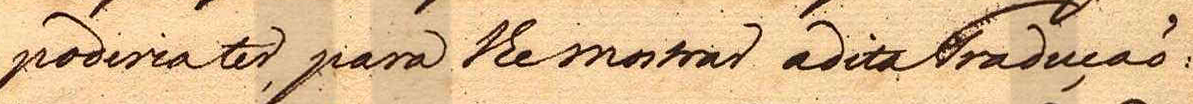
poderia ter, para lhe mostrar a dita Traduçaõ:
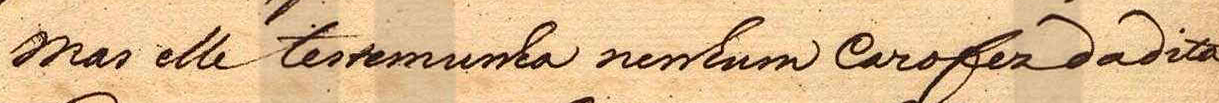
mas elle testemunha nenhum Cazo fez da dita
